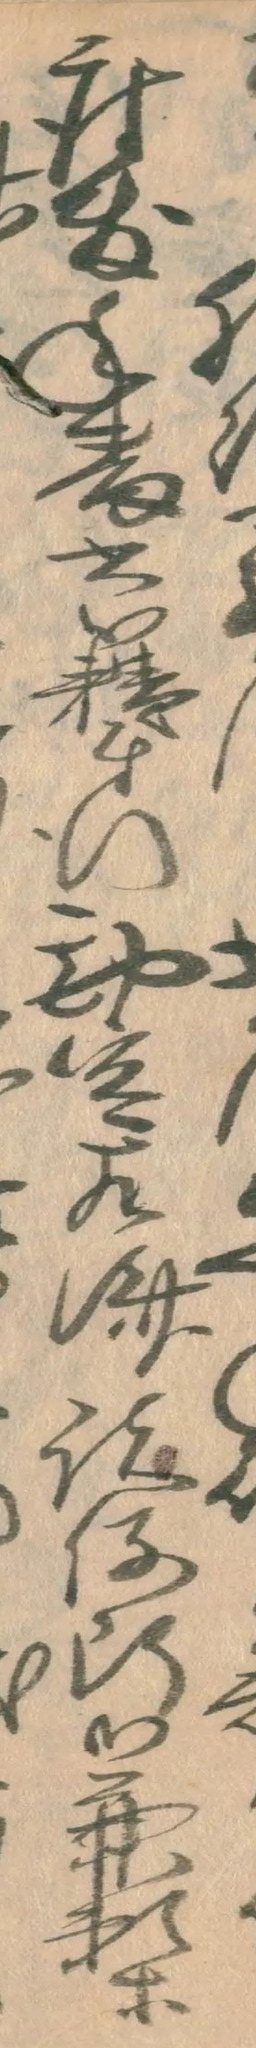座敷年番書籍奉行勘定相済諸役所御兼頼等
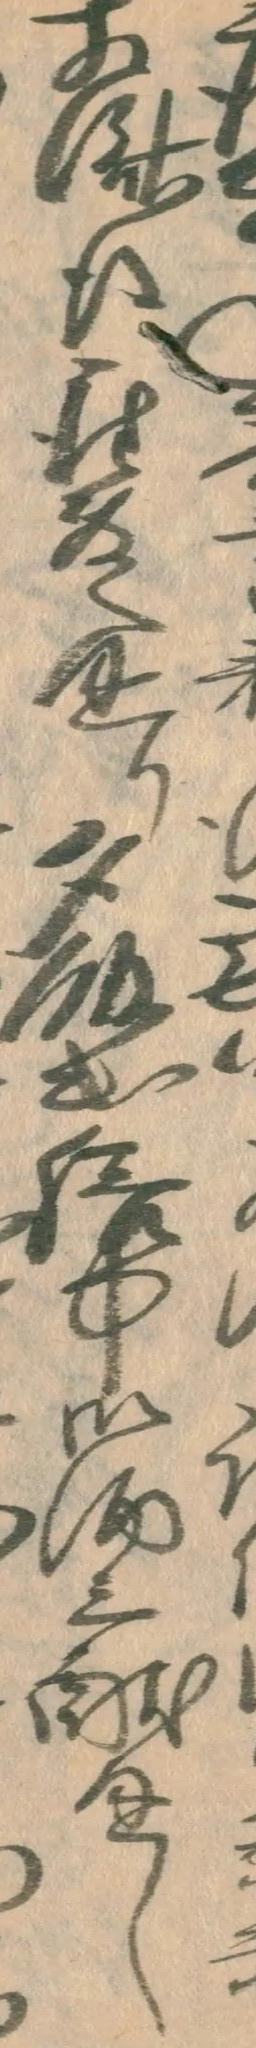相済後座敷へ通り夕飯出膳中御酒三献通し
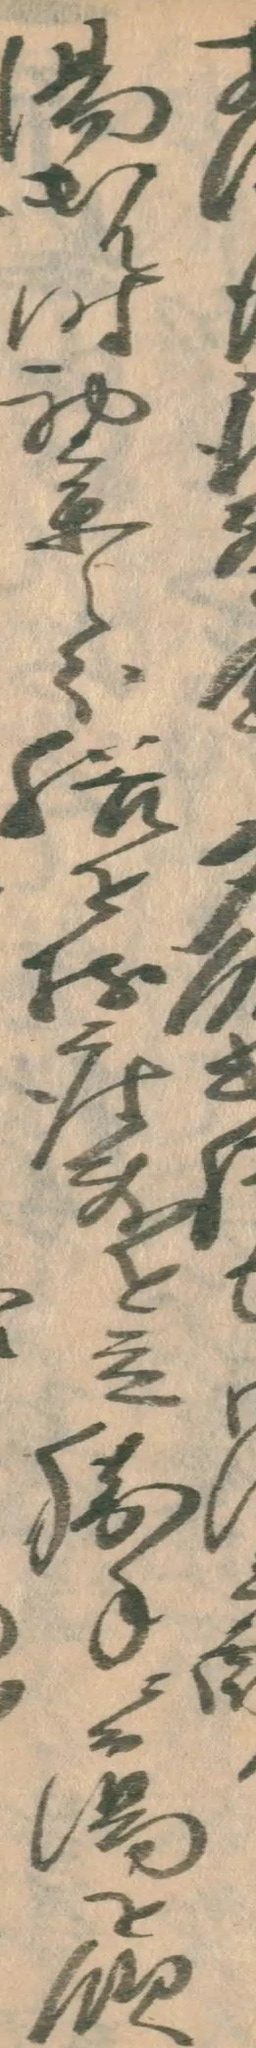湯出ル時初参之分膳を持座敷を立勝手ニ而湯を飲
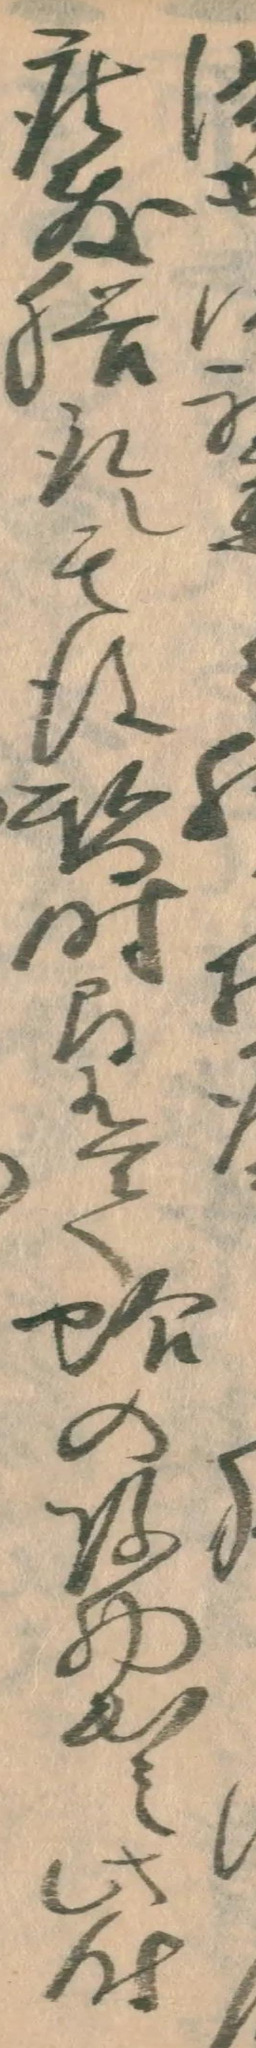座敷膳取て其後暫時間有りて蛤の吸物出之此時
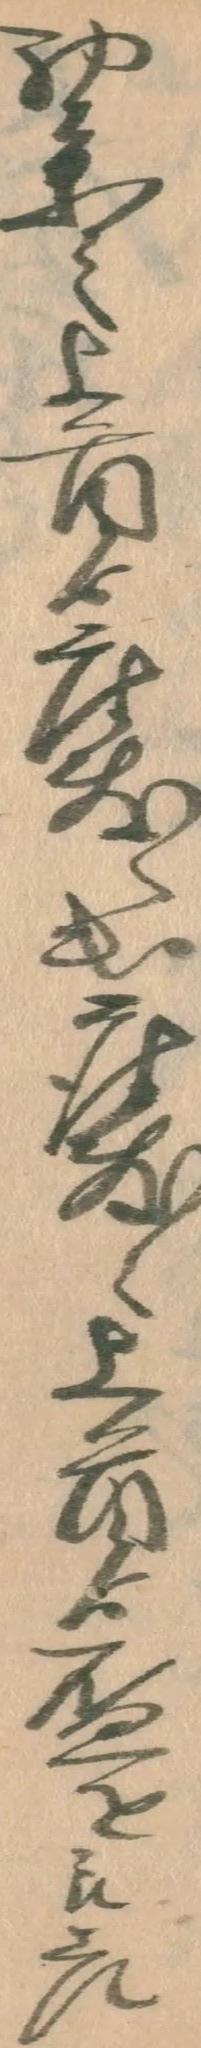初参之上首ゟ座敷へ出座敷之上首ゟ盃を被差
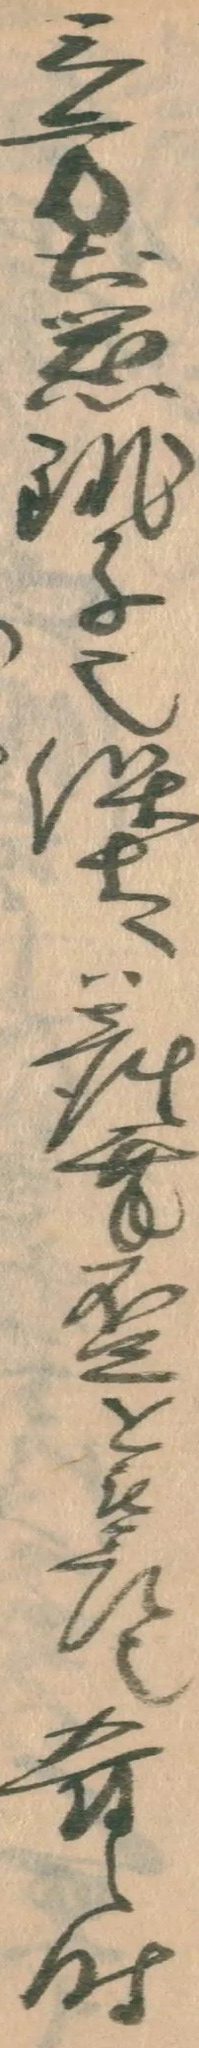三方土器銚子也保土へハ産幸盃を被差也肴之時
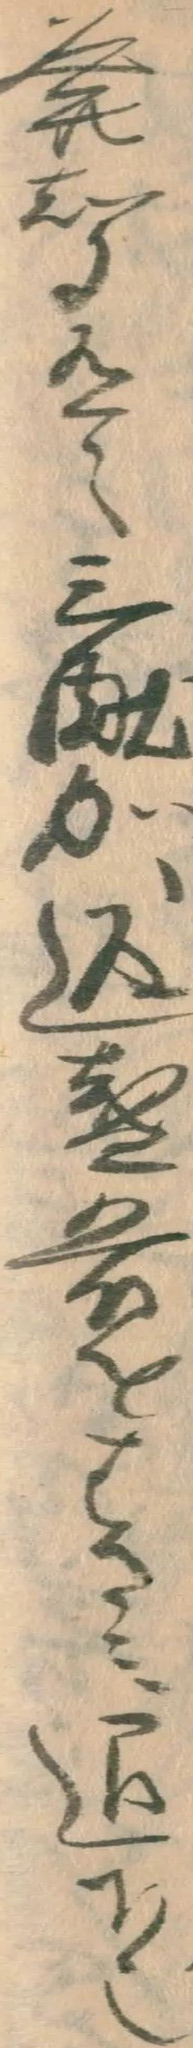発声有之三献加へ返盞肴をはさミ退下也
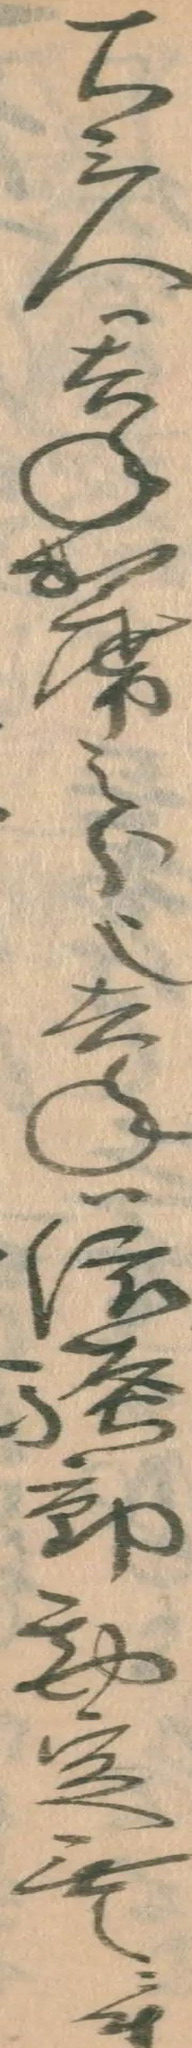右三人ハ去年出席之分也去年ハ依騒動勘定無之ニ付
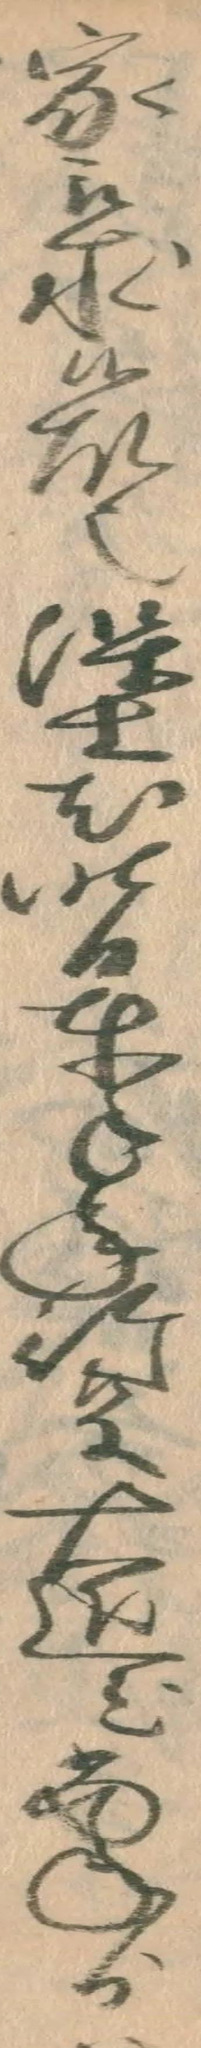家被求候故也保士尤昨日東手年行事右近迄当年ゟハ
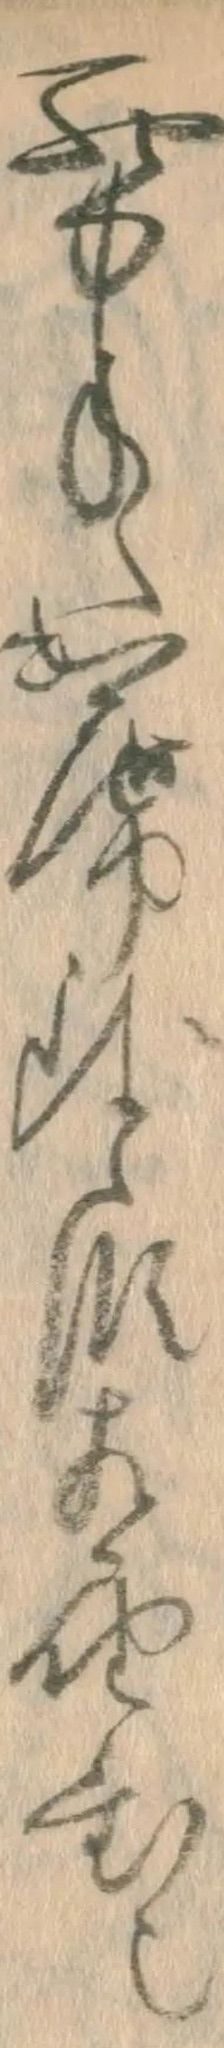西中手へ出席致候段相届置也
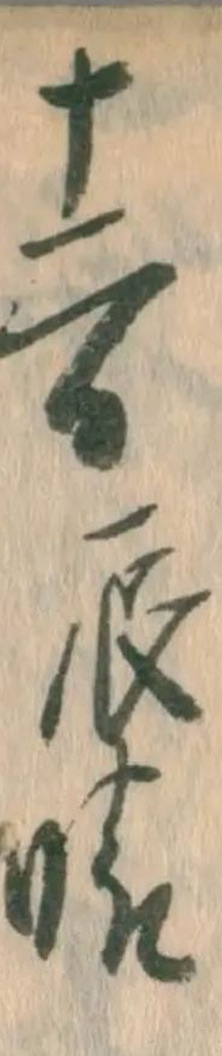十二日辰晴
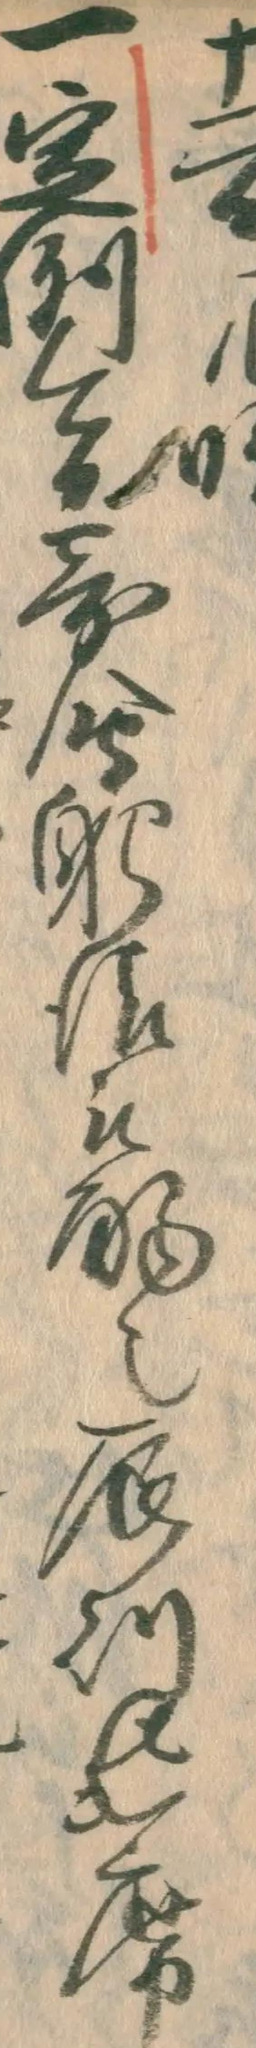一定例今日寄会躬清被触也辰ノ刻比出席
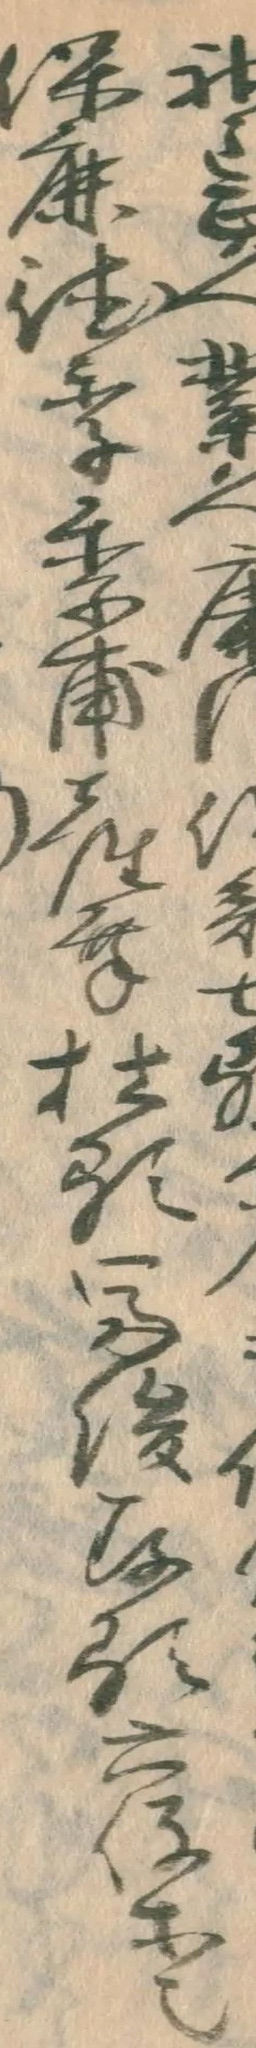保鹿徳季季甫産幸杜顕富俊存顕六役等也
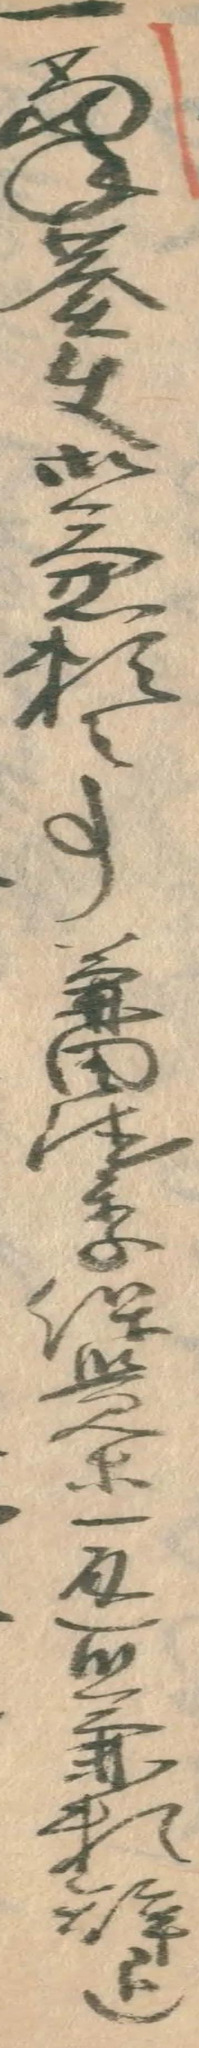一当年葵使御兼頼之事兼田徳季保覚等一通御兼頼辞退
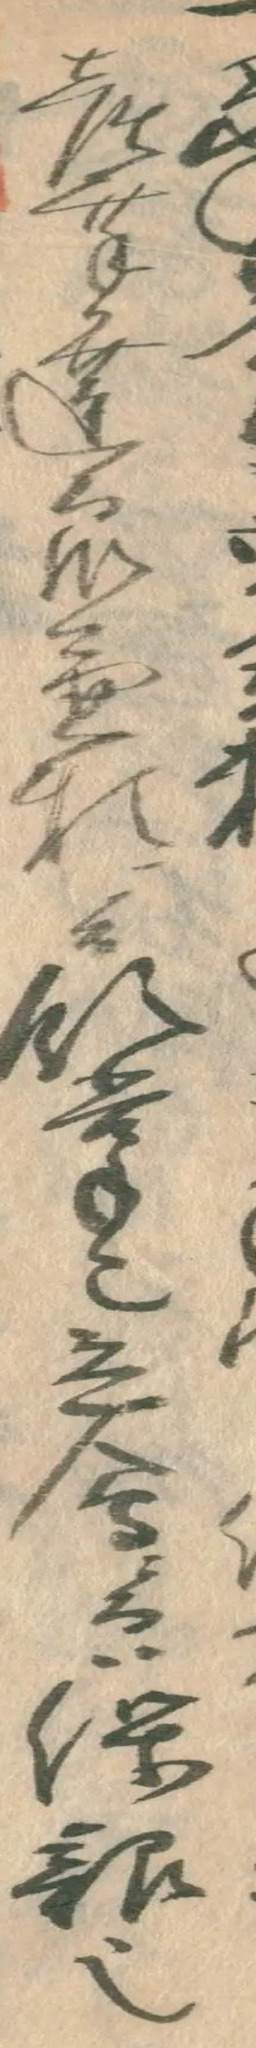産幸達而御兼頼ニ而領掌也立会ニ而ハ保韶也
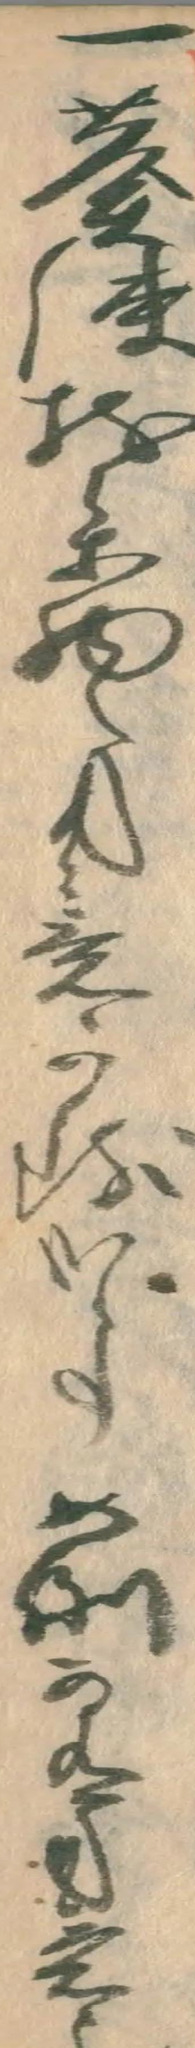一葵使持参物之用意可致哉事如例可有用意也
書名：賀茂社記録. 第60冊
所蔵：国立国会図書館 National Diet Library, JAPAN
